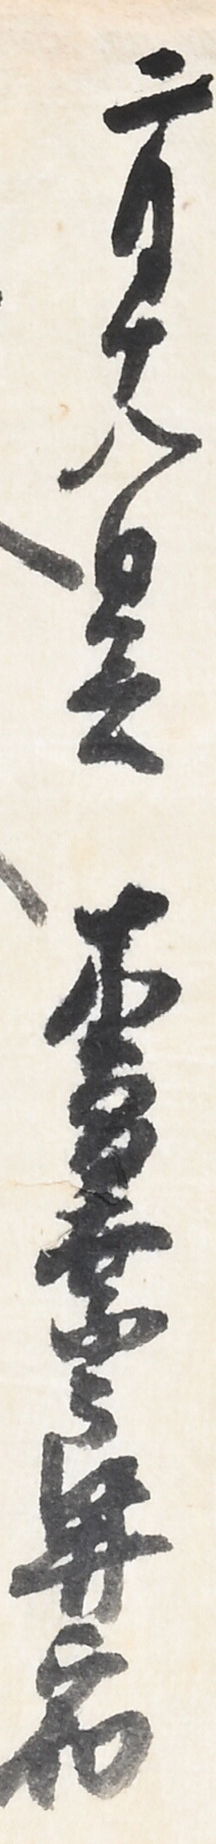二月十八日着木曽奈良井宿
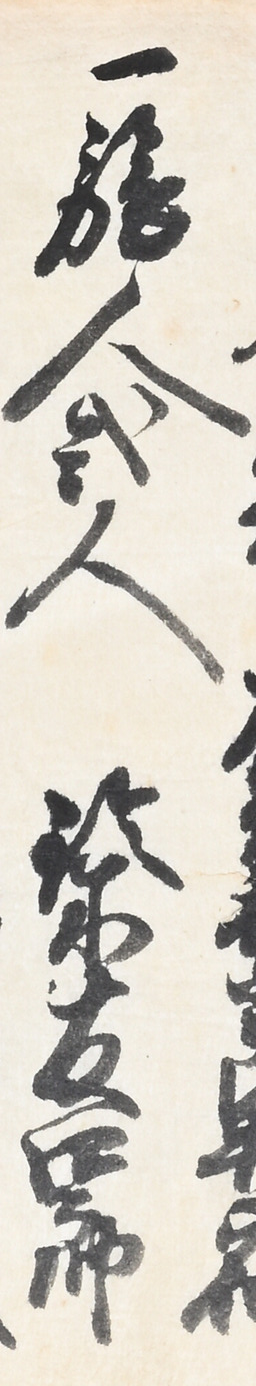一旅人弐人鈴木友四郎
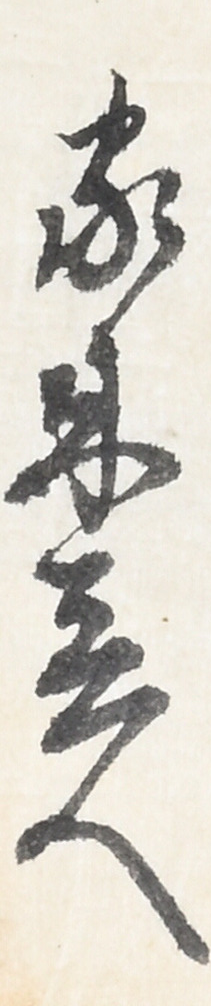家来壱人
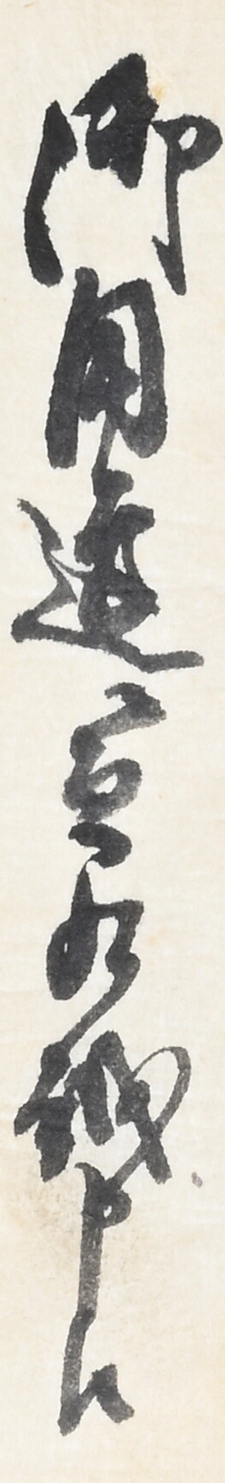御用達ニ而罷越申候
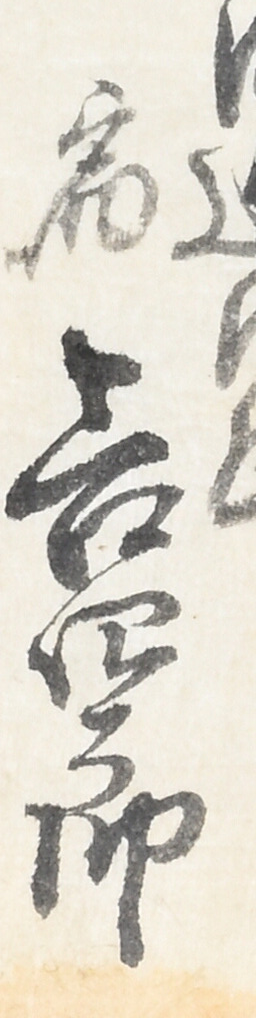宿善四郎
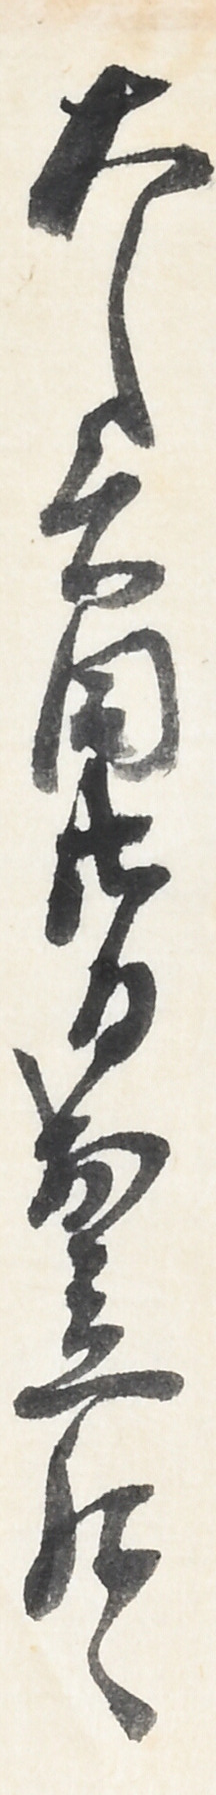右之者同廿日出立仕候

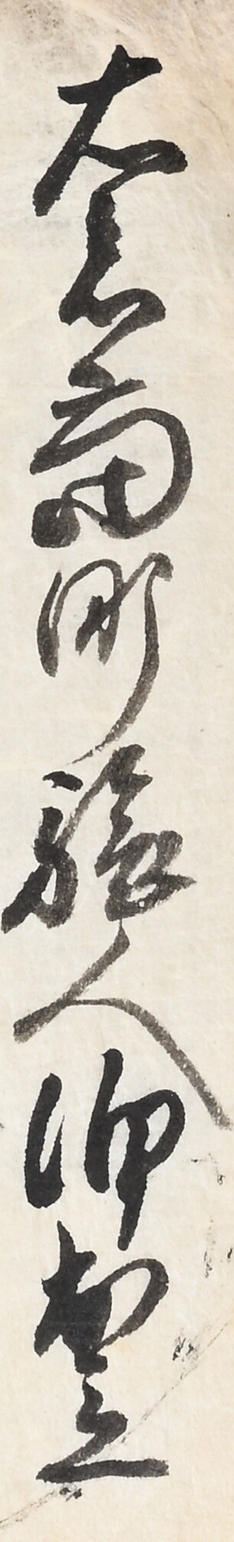右者当町旅人泊出立
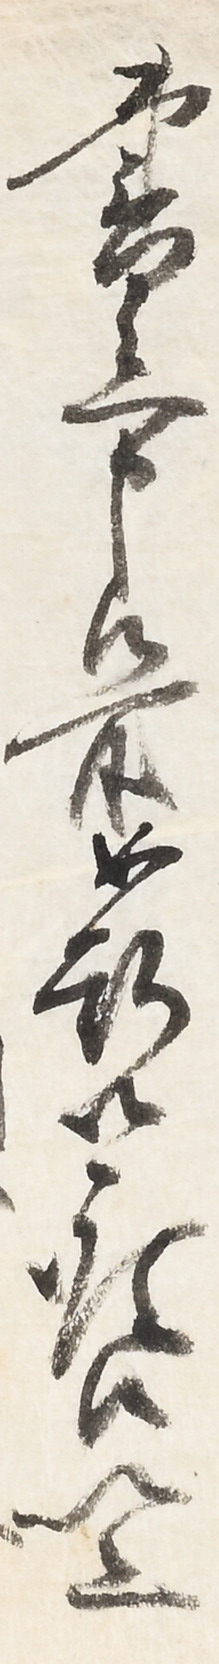書上申候所如斯御座候以上
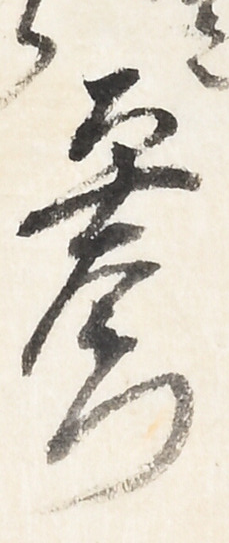理右衛門
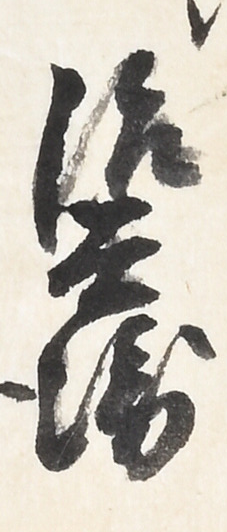治兵衛
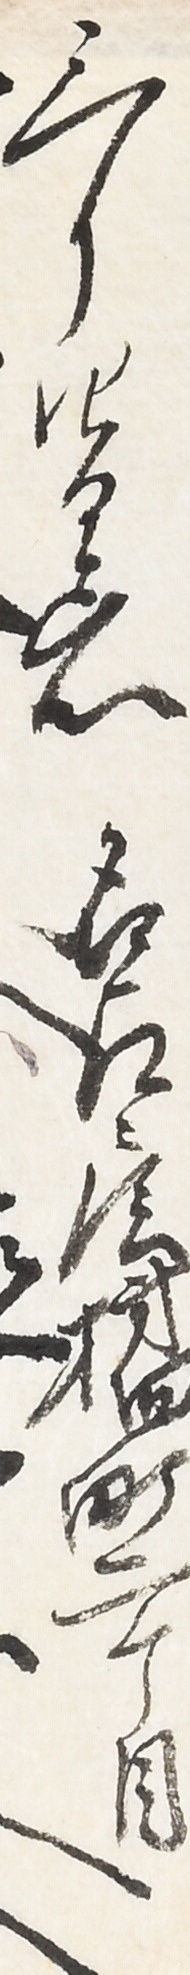三月四日着名取屋橘町二丁目
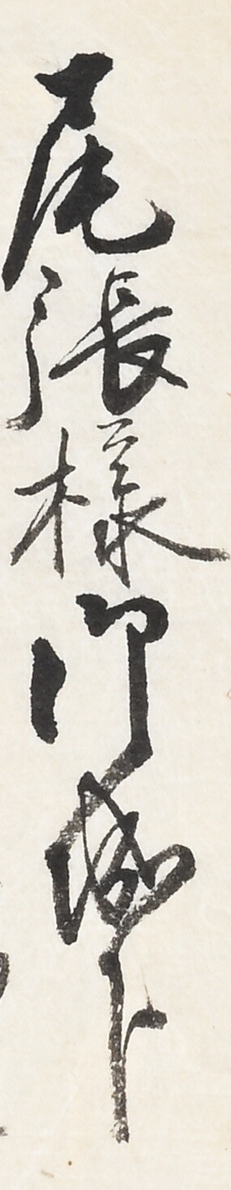尾張様御城下
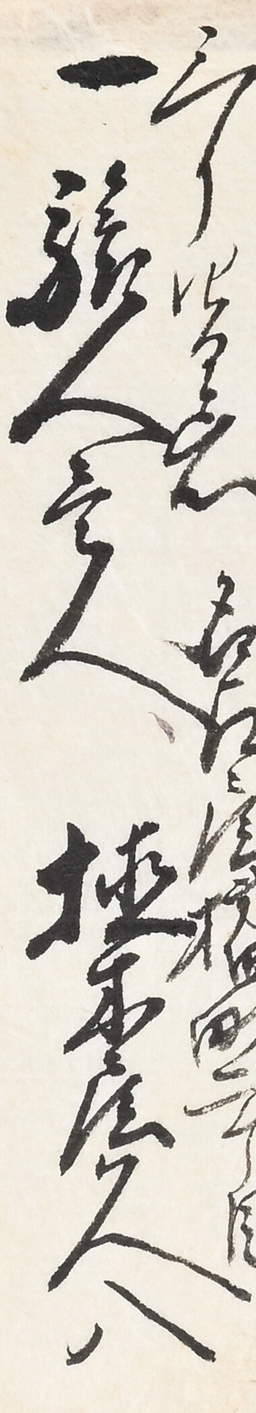一旅人壱人植木屋久八
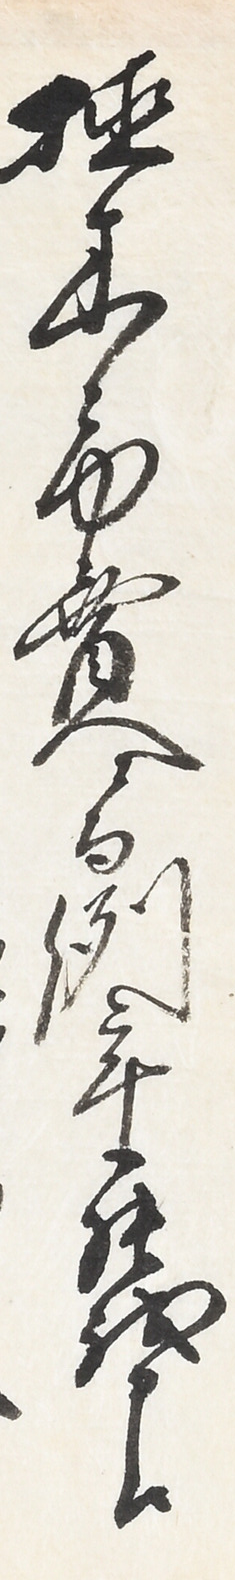植木商売ニ而例年罷越申候
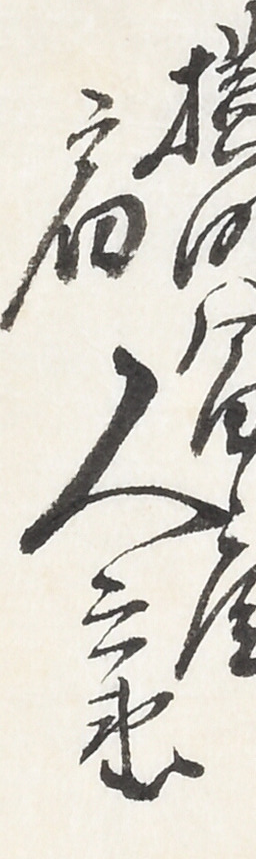宿久兵衛
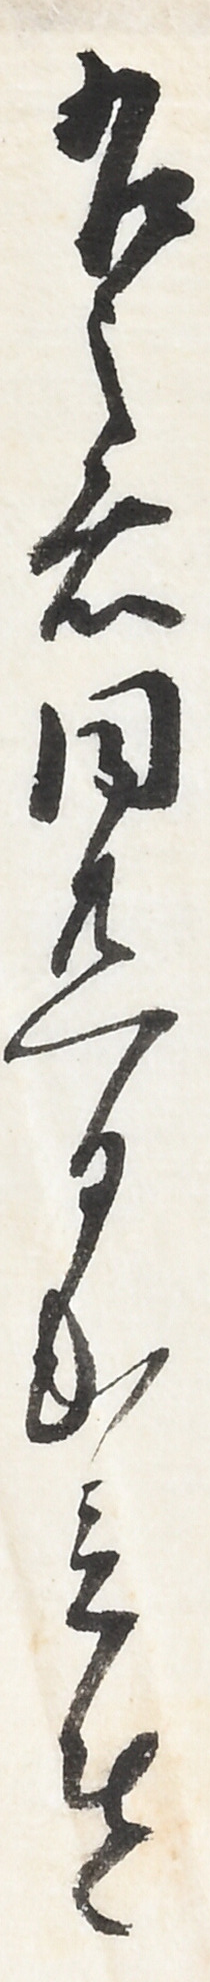右之者同廿一日出立仕候
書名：旅人泊控帳
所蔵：伊那市立高遠町図書館・合同会社AMANE
